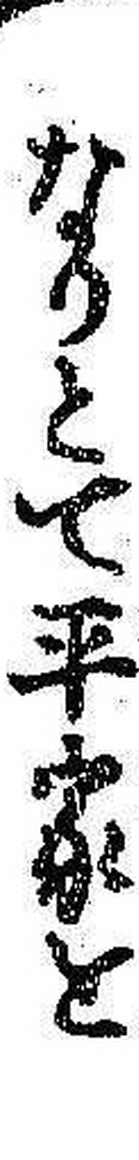なりとて平家を
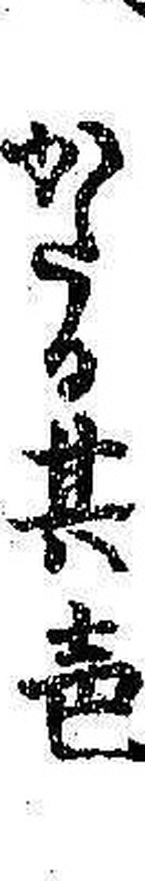かたる其声
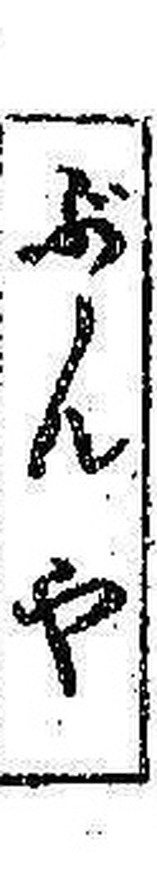ぶんや
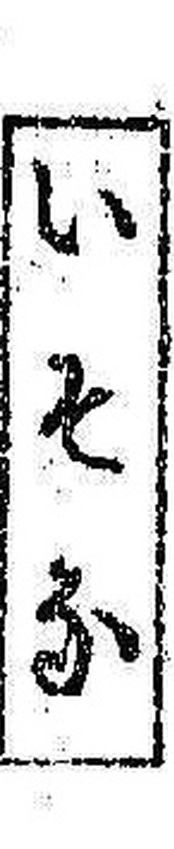いそな

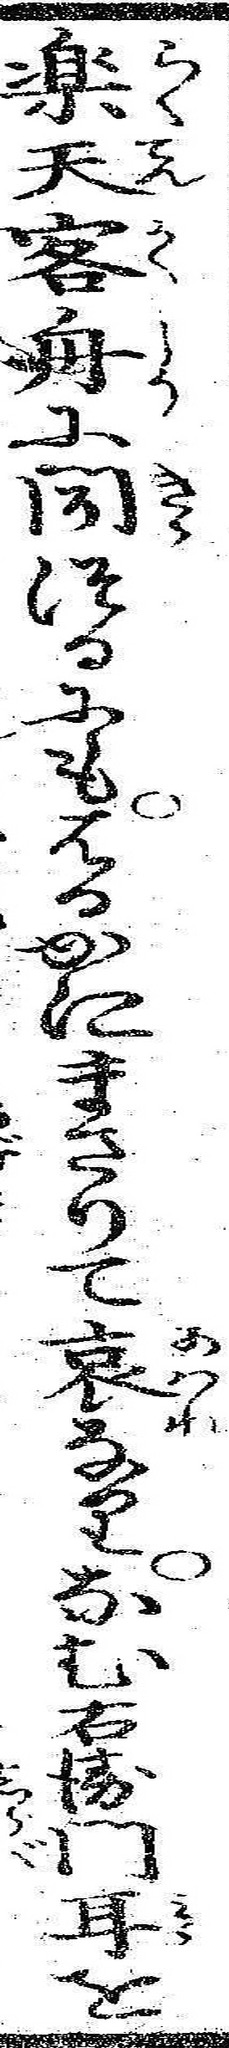楽天客舟に聞つるにも。はるかにまさりて哀なり。なむ右衛門耳を
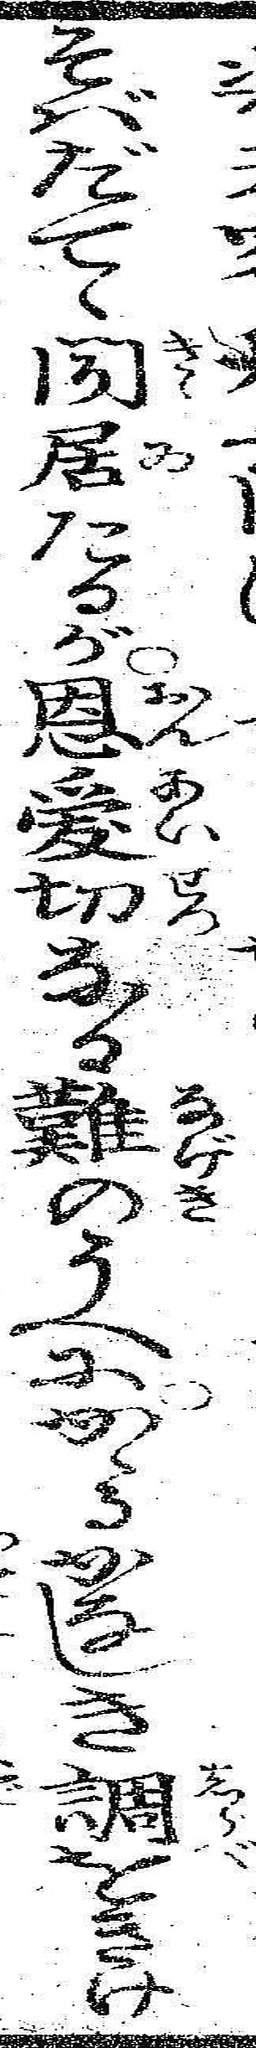そばだてゝ聞居たるが。恩愛切なる難のうへに。かゝるかなしき調をきけ
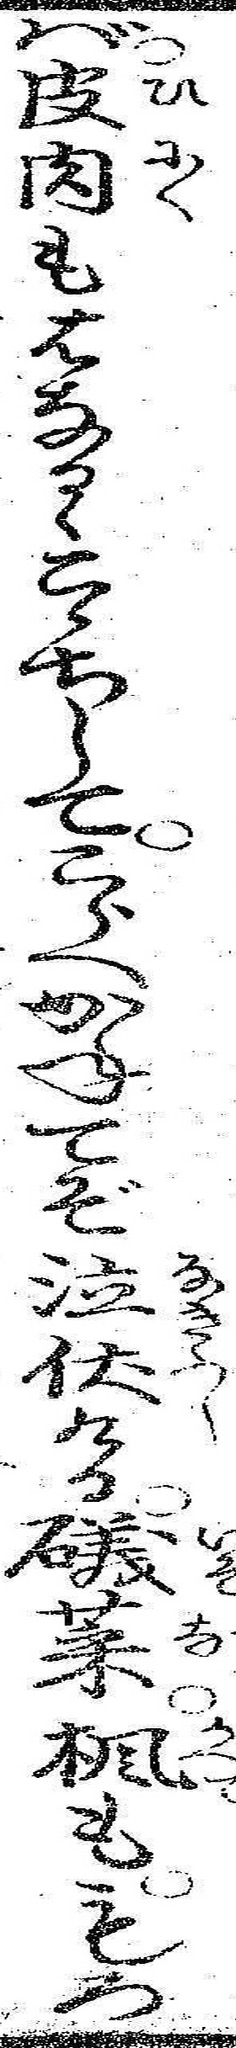ば。皮肉もはなるゝこゝちして。こらへかねてぞ泣伏ける。礒菜。楓も。もろ
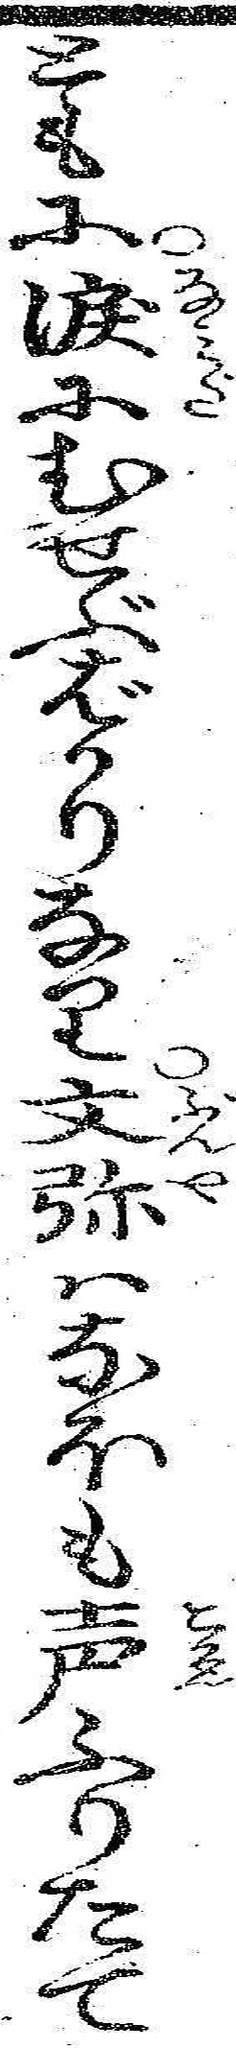ともに。涙にむせぶばかりなり。文弥はなほも声ふりたて
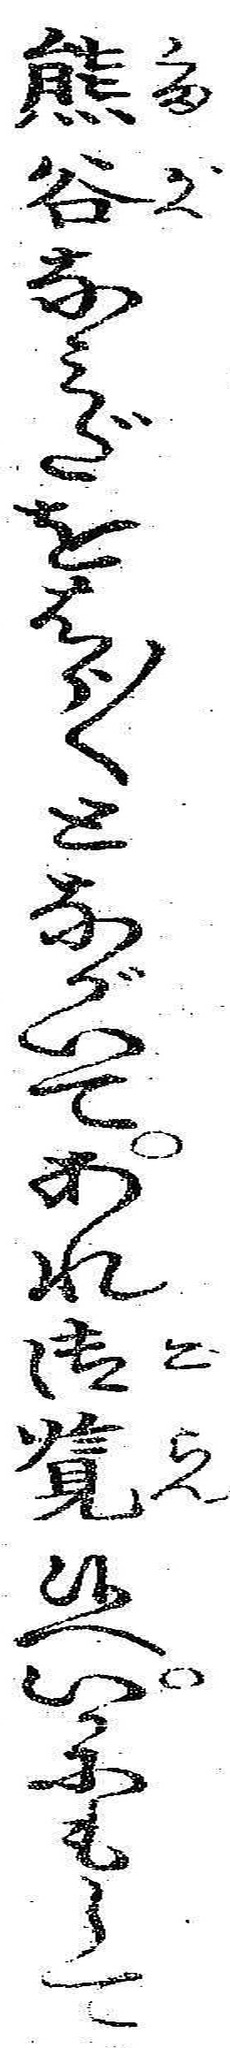熊谷なみだをはら〳〵とながいて。あれ御覧候へ。いかにもして
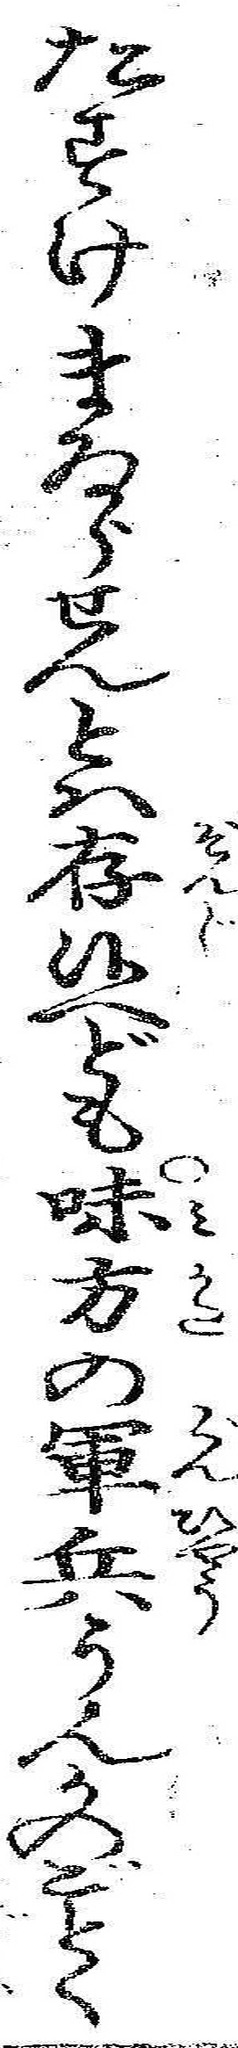たすけまゐらせんとは存候へども。味方の軍兵うんかのごとく
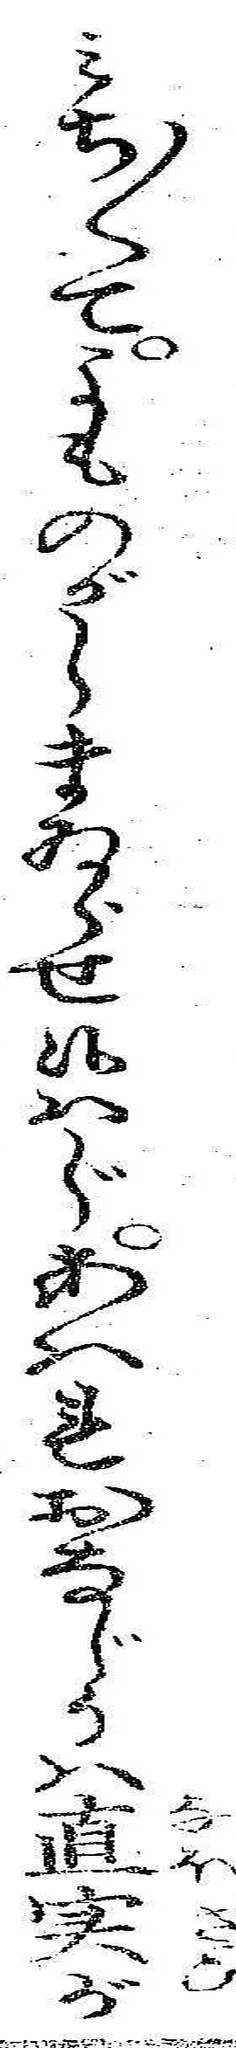みち〳〵て。よものがしまゐらせ候はじ。あはれおなじうは直実が
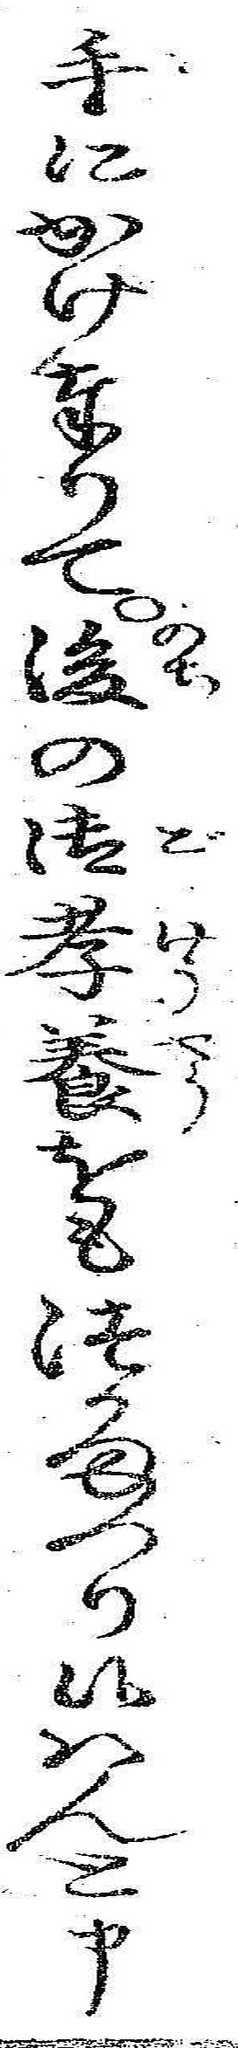手にかけ奉りて。後の御孝養をもつかまつり候はんと申
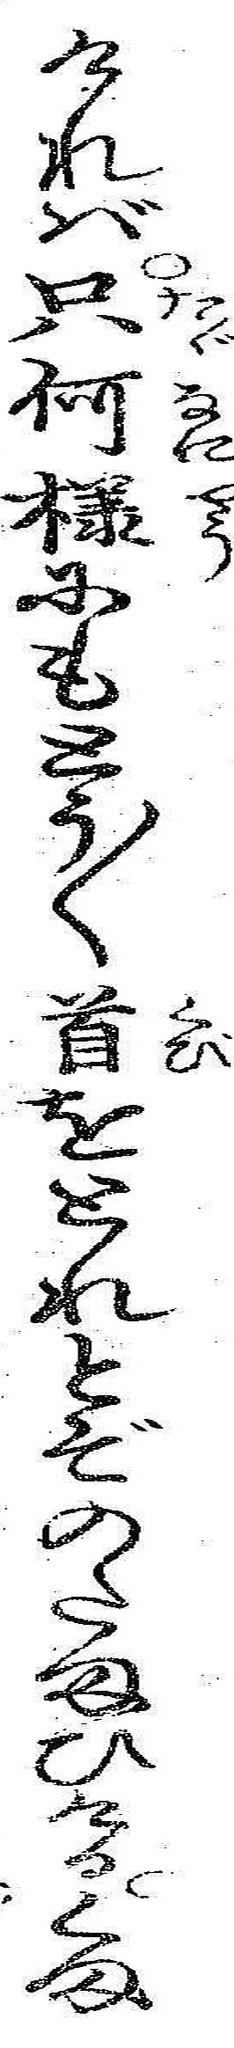ければ。只何様にもとう〳〵首をとれとぞのたまひける。くま
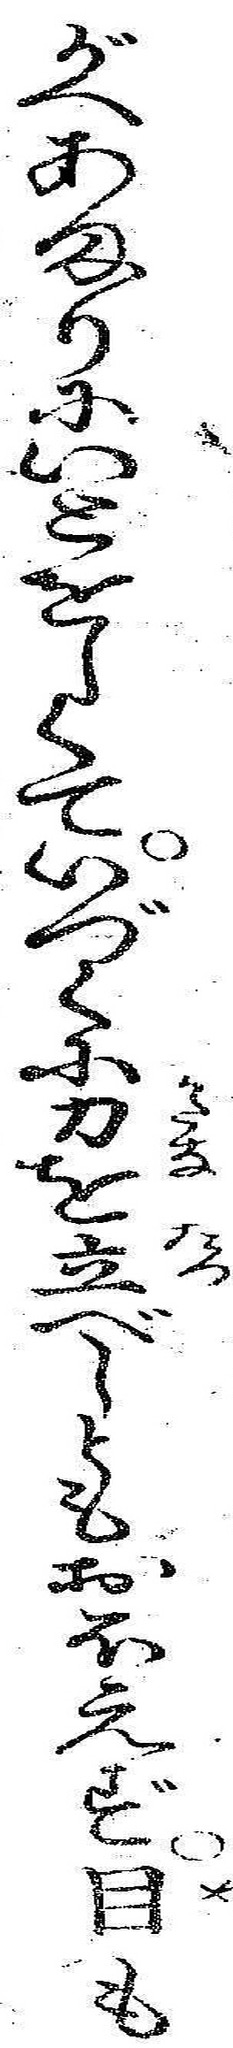がへあまりにいとをしくて。いづくに刀を立べしともおほえず。目も
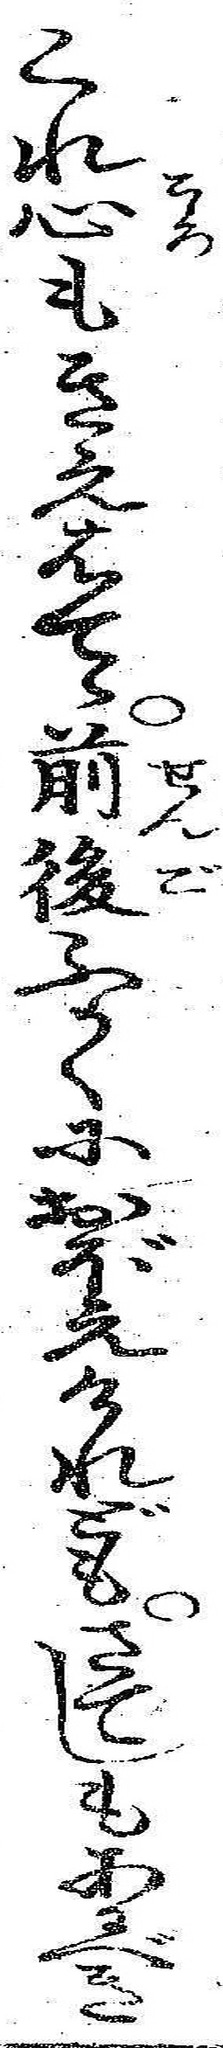くれ心もきえはてゝ。前後ふかくにおぼえけれども。さてしもあるべき
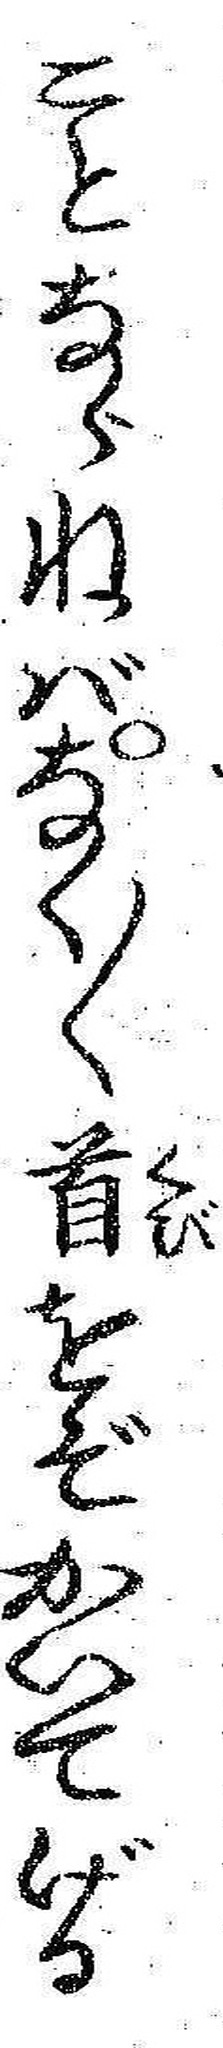ことならねば。なく〳〵首をぞかいてげる
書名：昔話稲妻表紙
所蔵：国文学研究資料館
